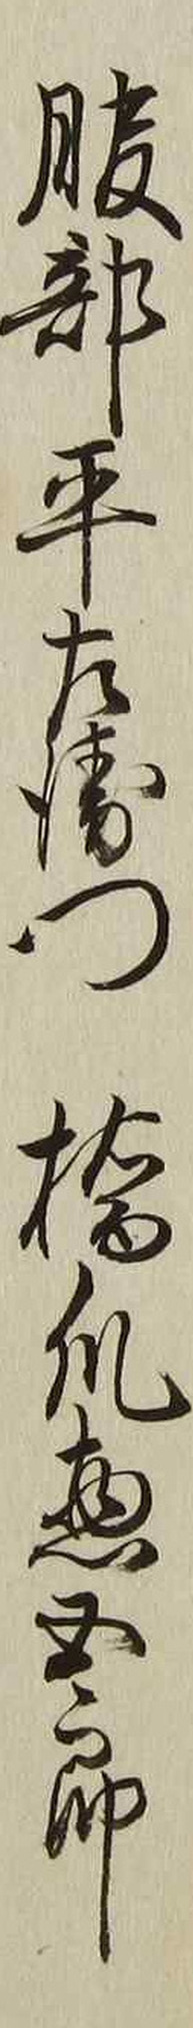服部平左衛門橋爪惣五郎
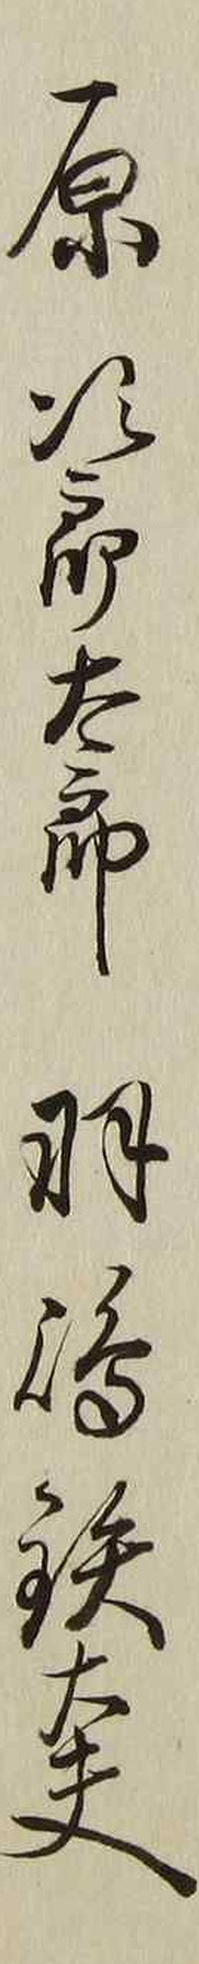原次郎太郎羽島鉄大夫
